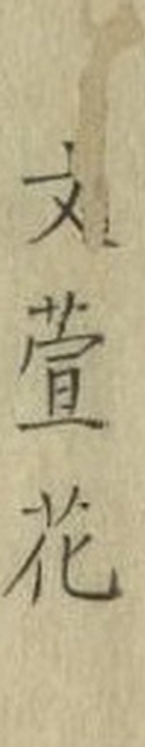文萱花
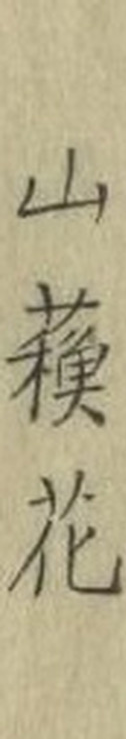山蘓花
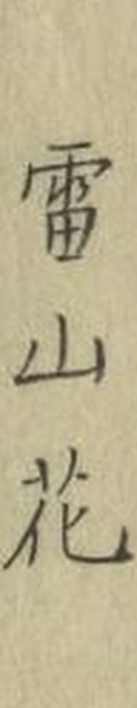雷山花
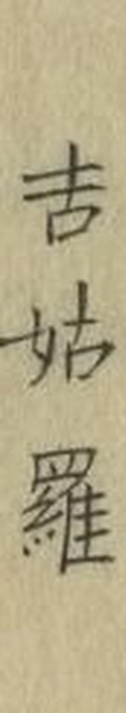吉姑羅
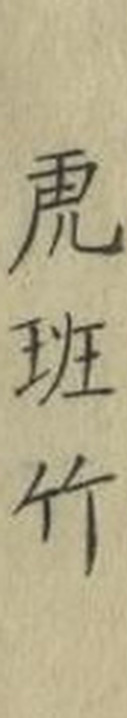虎班竹

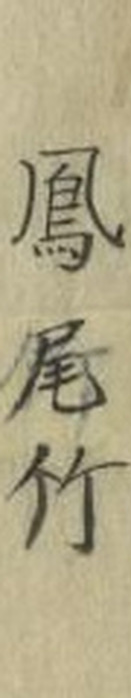鳳尾竹
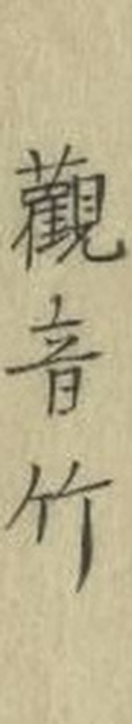観音竹
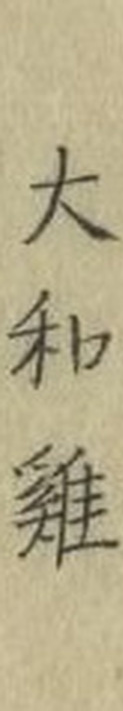大和雞
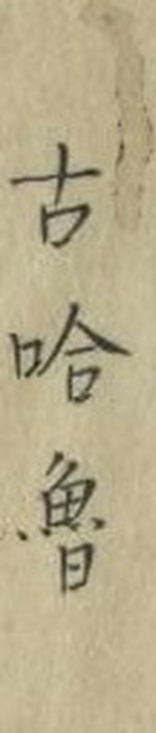古哈魯

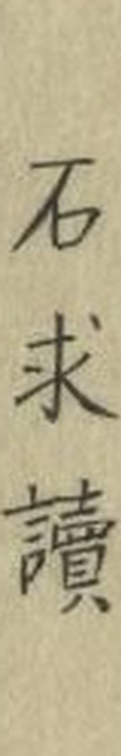石求読
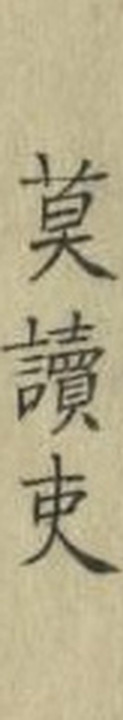莫読吏
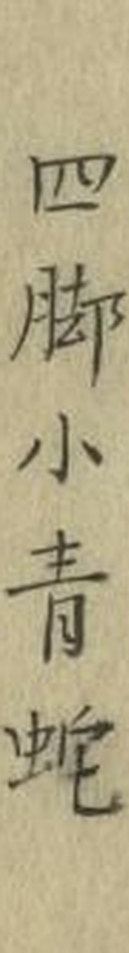四脚小青蛇
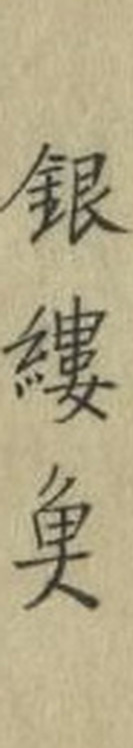銀縷魚
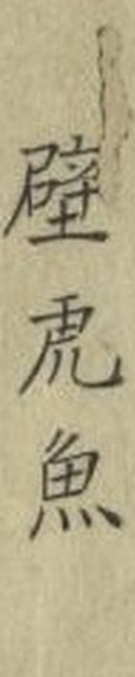壁虎魚
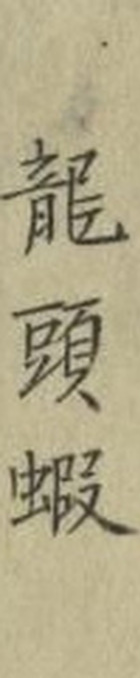龍頭蝦

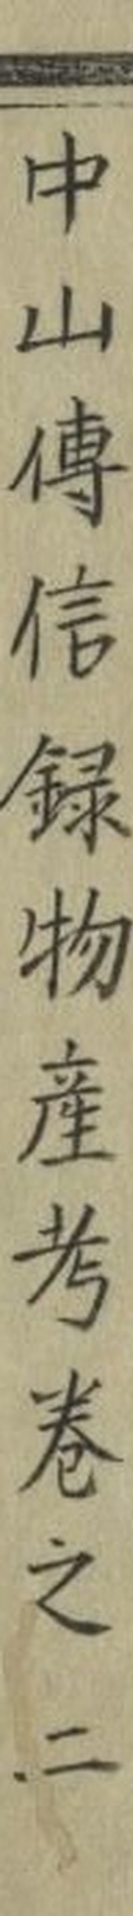中山伝信録物産考巻之二
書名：中山伝信録物産考 地
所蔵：University of the Ryukyus Library
